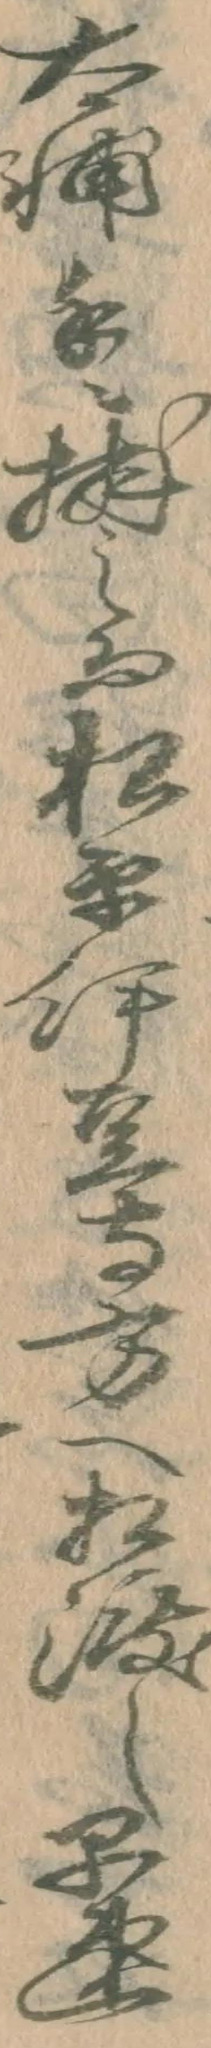太輔手に捕之而松平伊豆守方へ相渡し早速
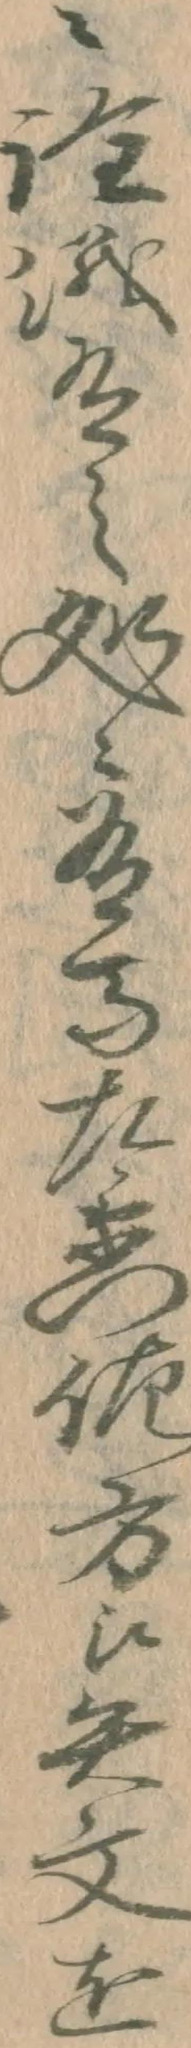に詮議有之処に有馬左衛門佐方江矢文を
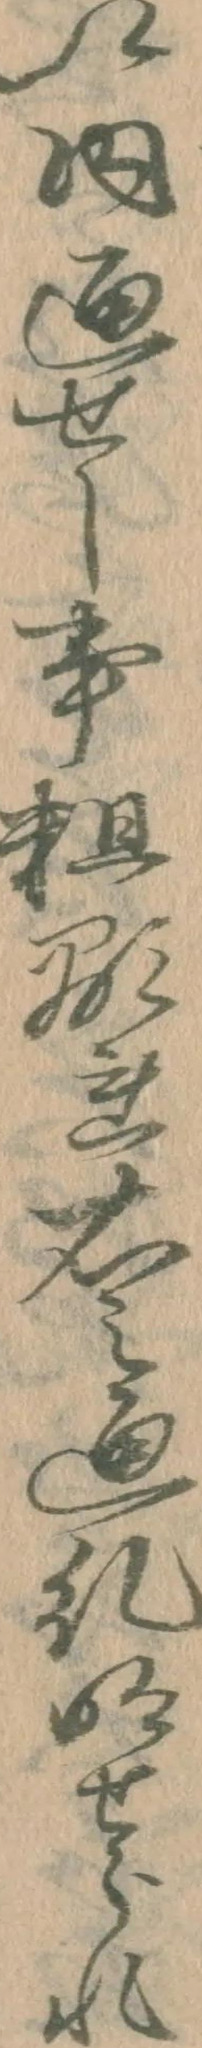以内通せし事粗顕連右之通糾明せられ
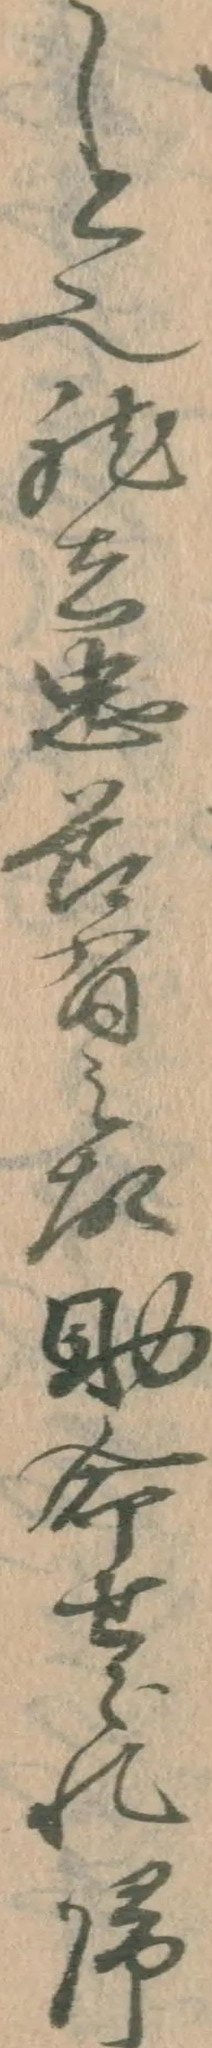しと也然者忠節有之故助命せられ帰
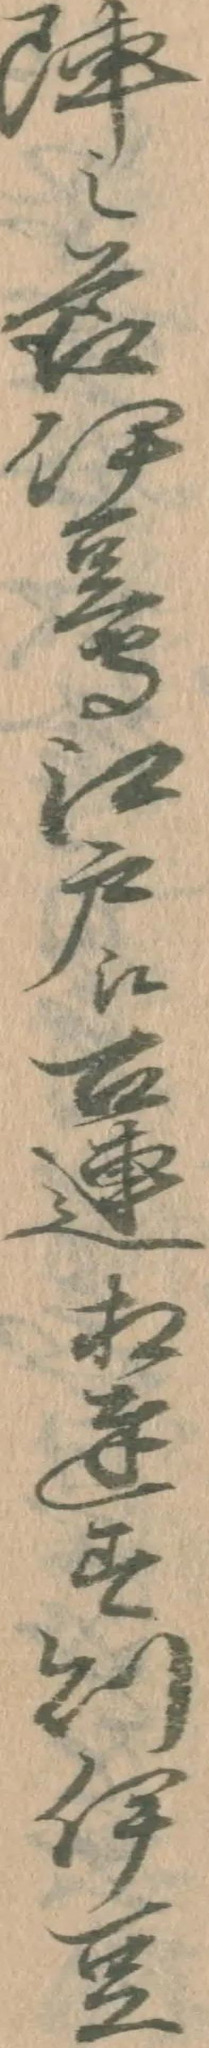陣之節伊豆守江戸江召連相達春則伊豆
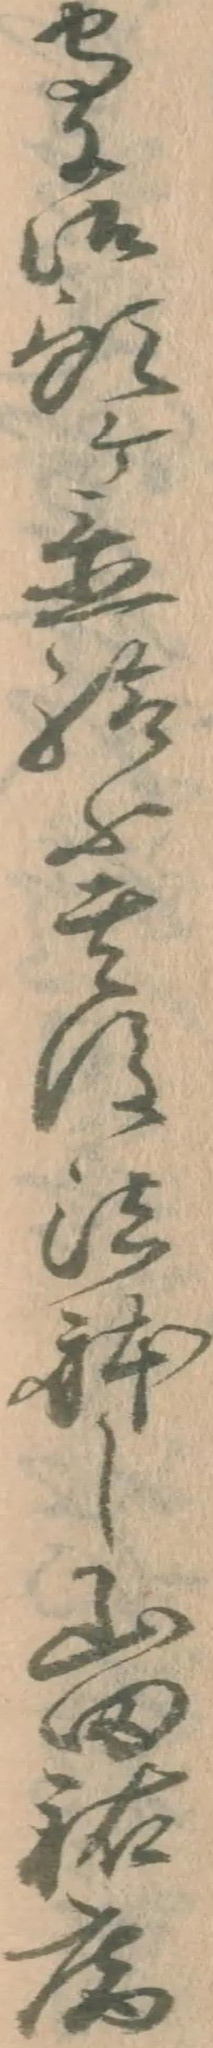守尓御預け置給ふ其後法躰し山田祐庵
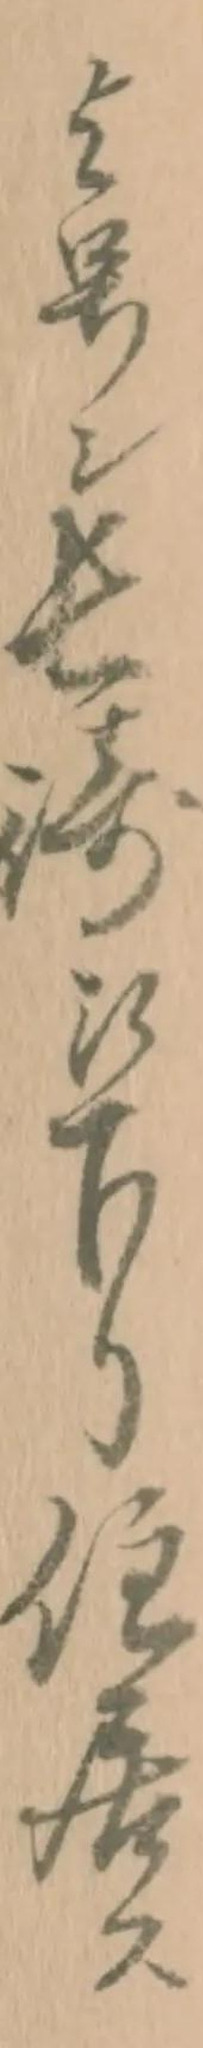与号し長崎江下り住居す
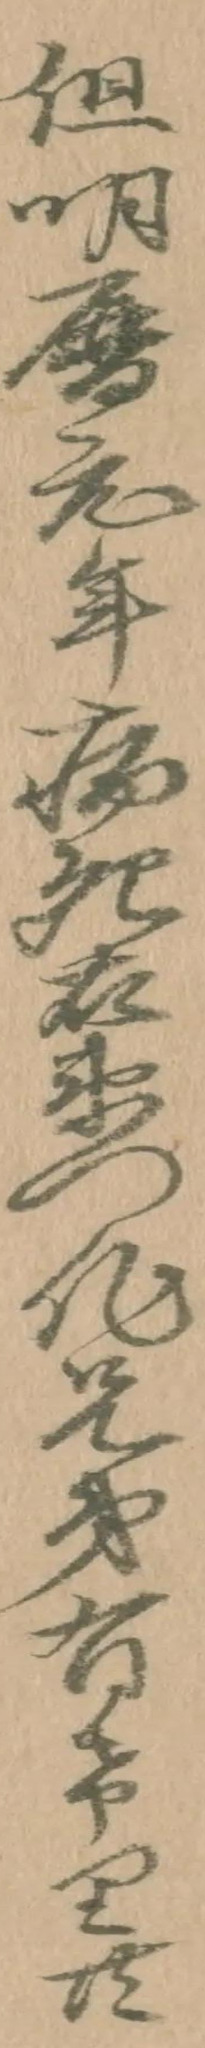但明暦元年病死右衛門作兄弟有希里共
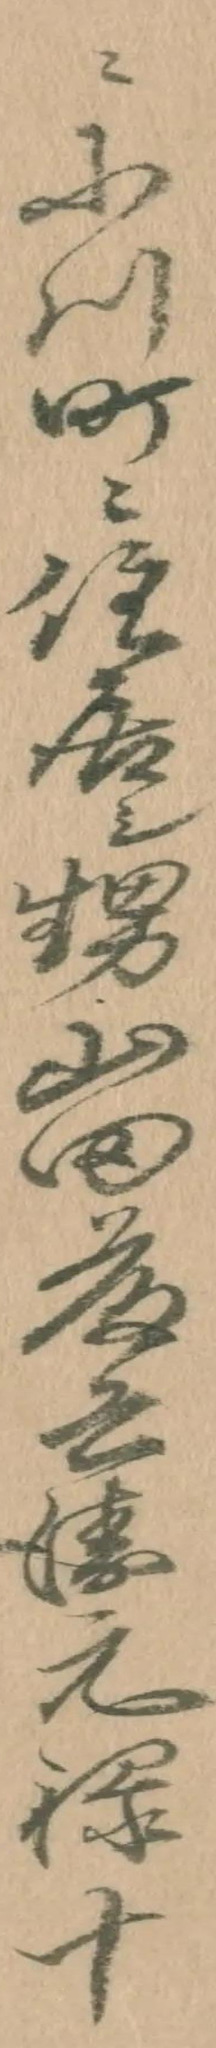に小川町に住居し甥山田藤兵衛元禄十
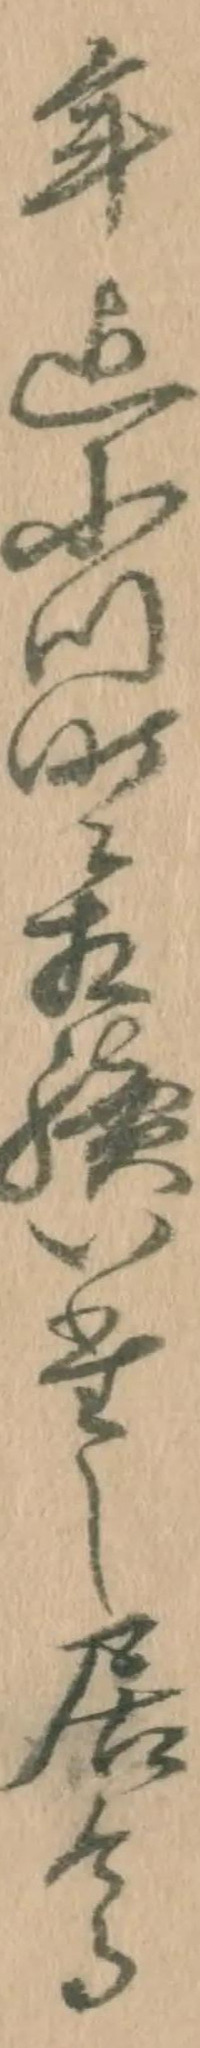年迄小川町に相続い堂し居ける
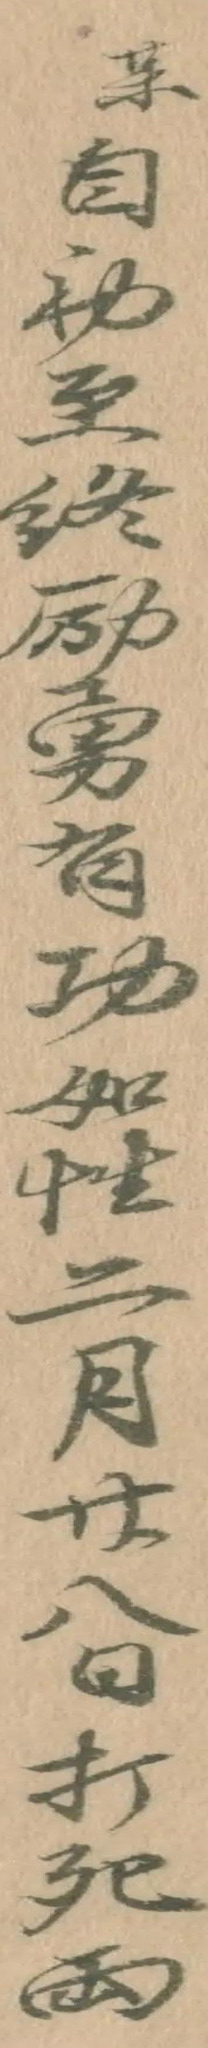某自初至終励勇有功如性二月廿八日打死両
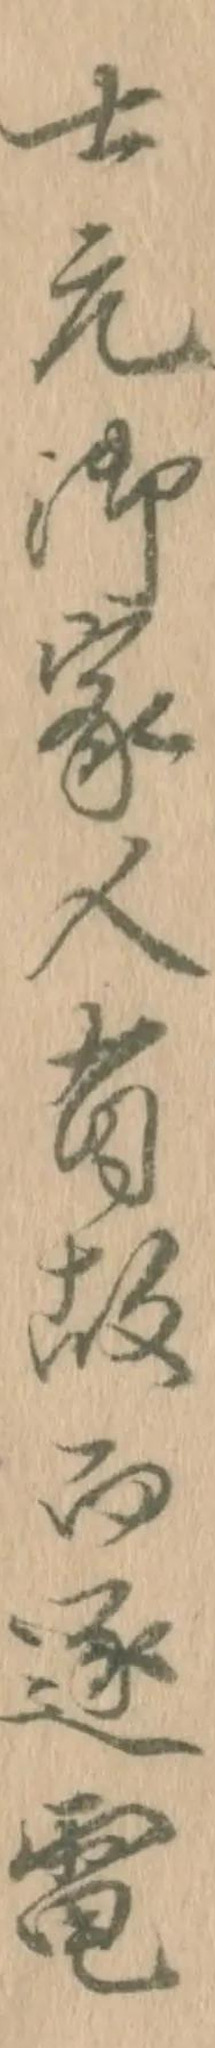士元御家人有故而逐電
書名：切支丹御退治記 49巻. [8]
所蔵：国立国会図書館 National Diet Library, JAPAN
